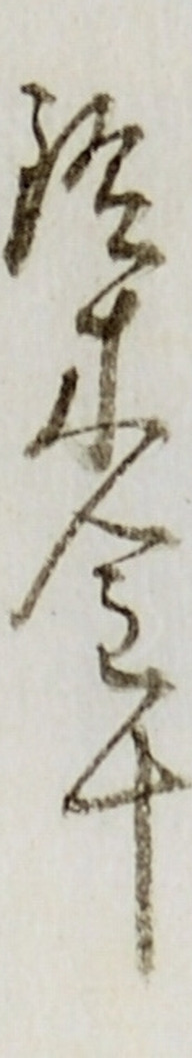鈴木金十
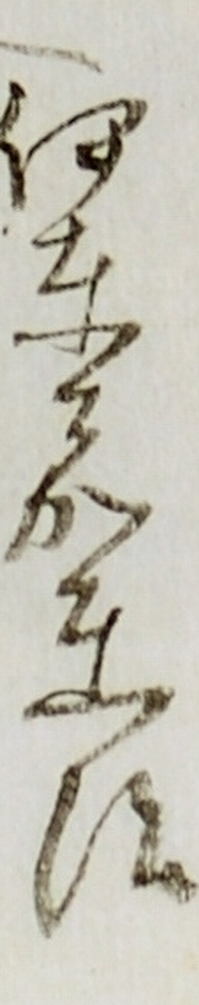伊東嘉東治
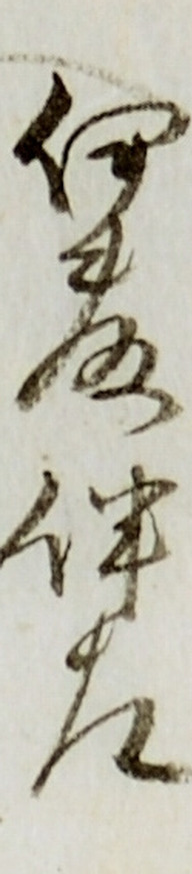伊藤伴太
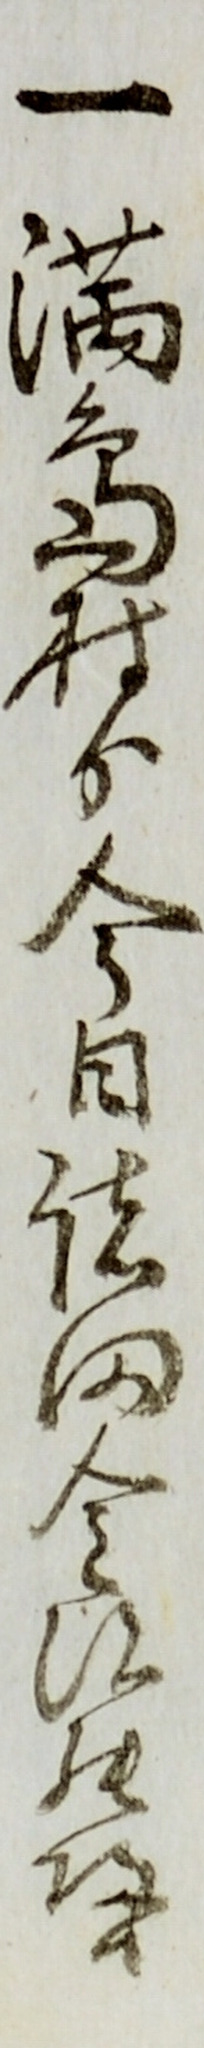一満島村ゟ今日諸田金治罷帰候
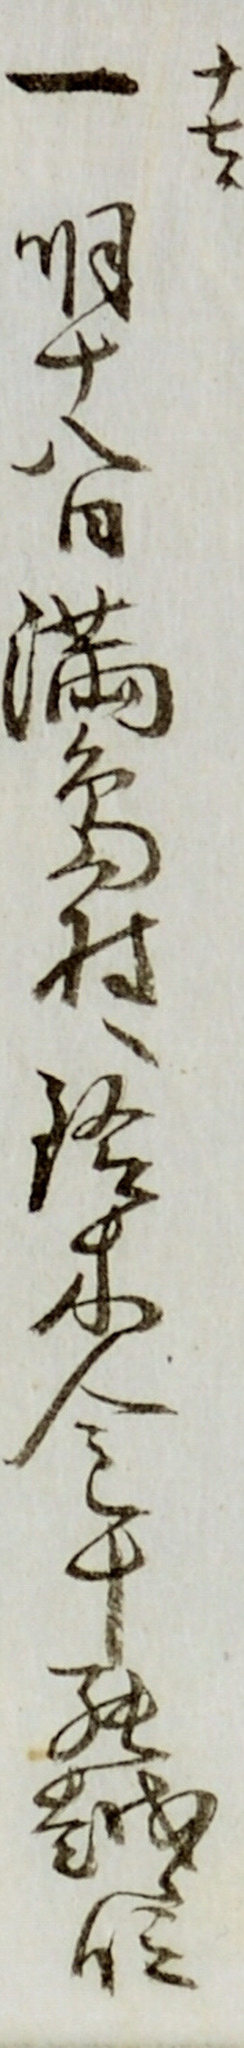一明十八日満島村へ鈴木金十罷越候段
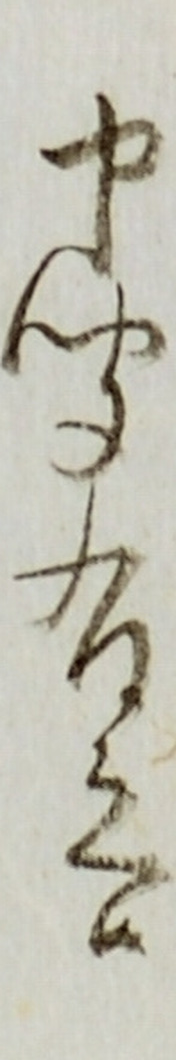申聞有之候
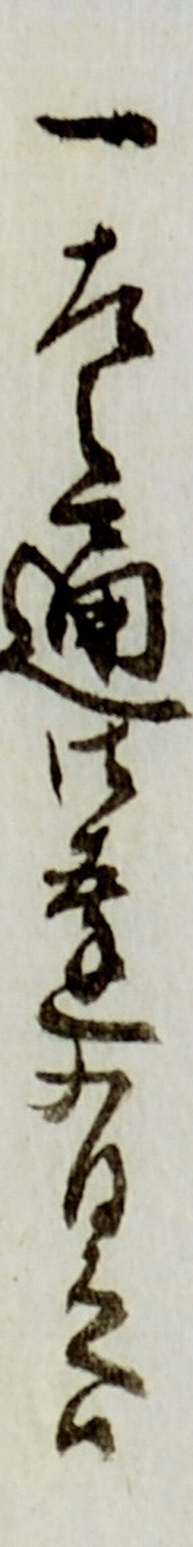一左之通御達有之候
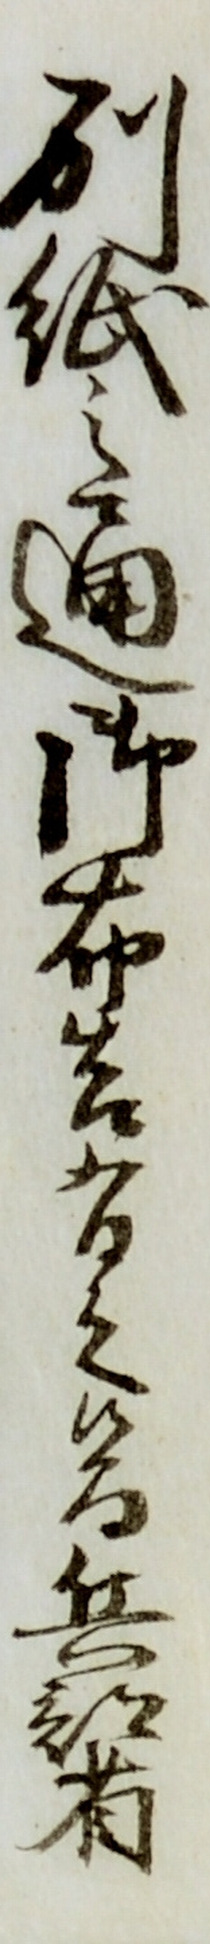別紙之通御布告有之候間兵部省
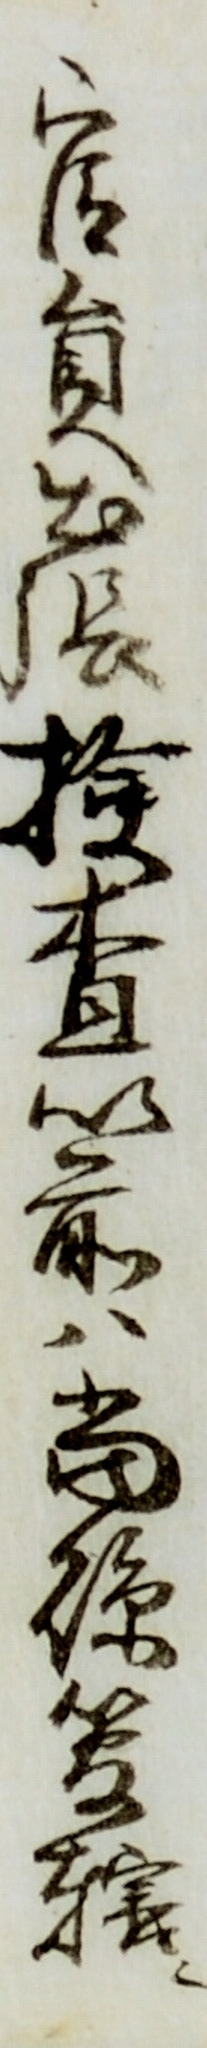官員出張検査以前は当県管轄に
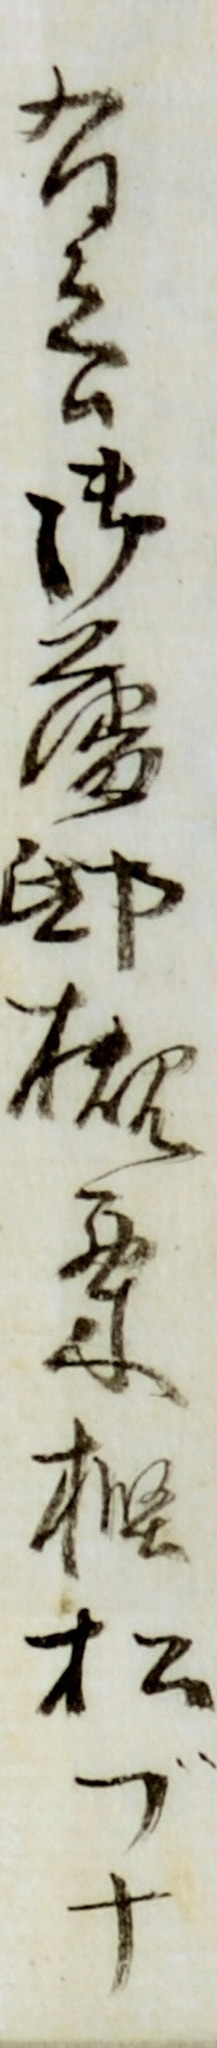有之候御藩邸槻栗樫松ブナ
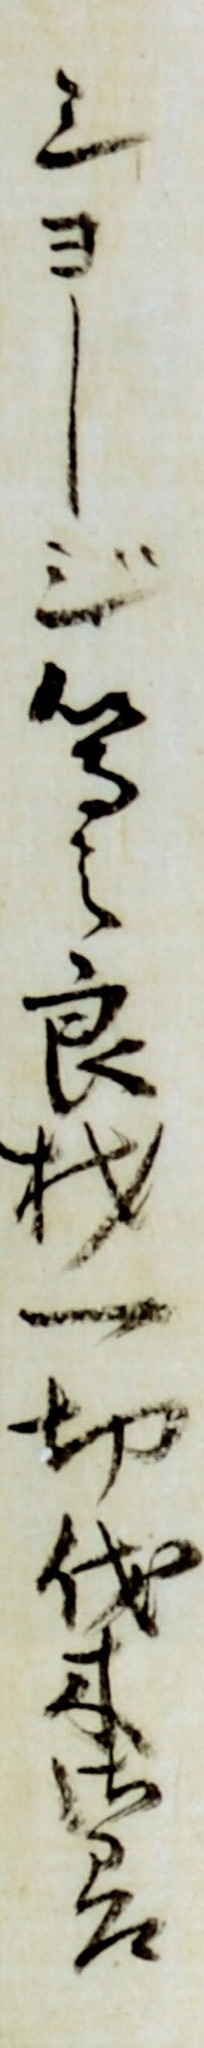ショージ等之良材一切伐木御差

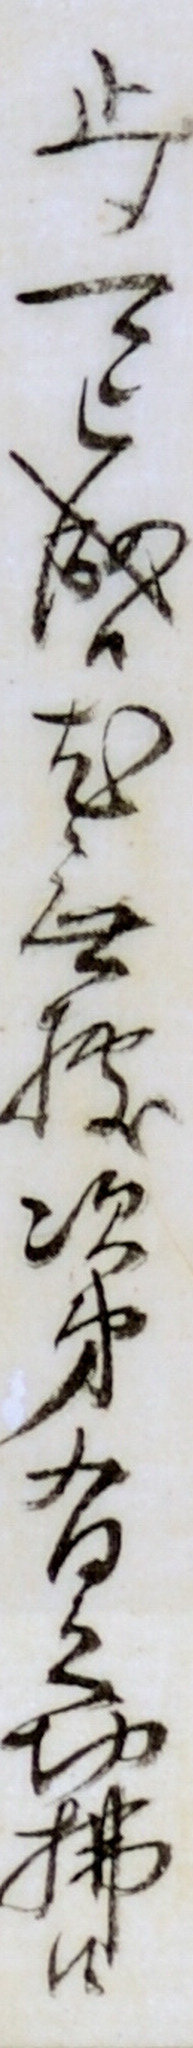止メ可被成候尤無拠次第有之切払候
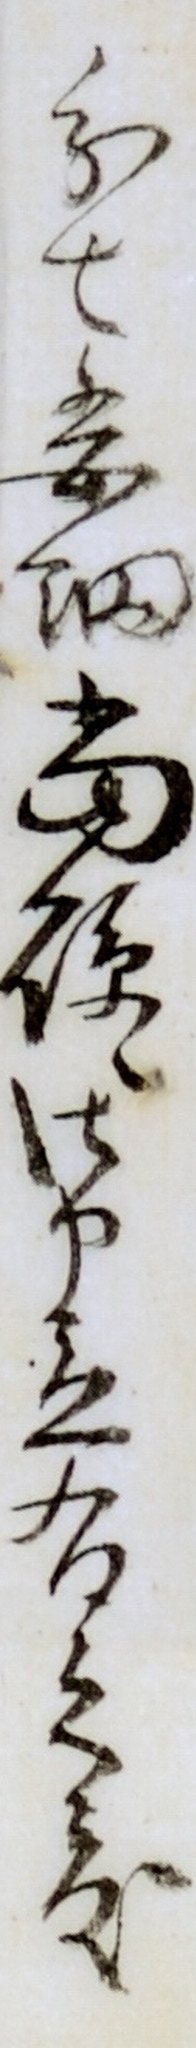分は委細当県へ御申立有之度
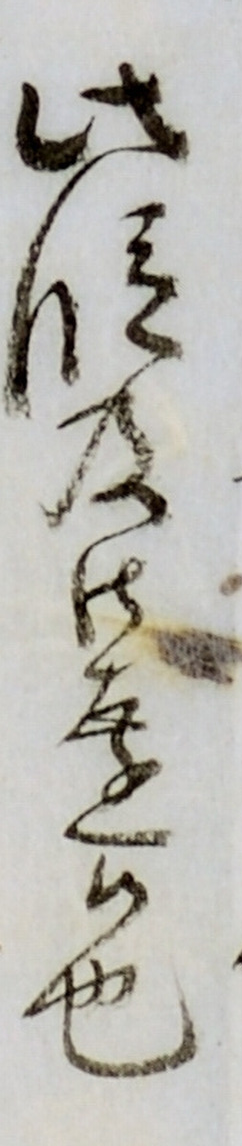此段及御達候也
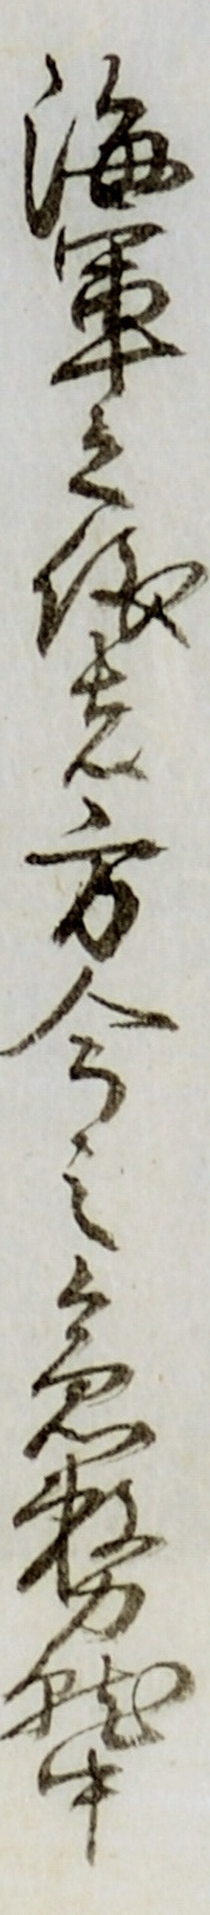海軍之儀は方今之急務就中
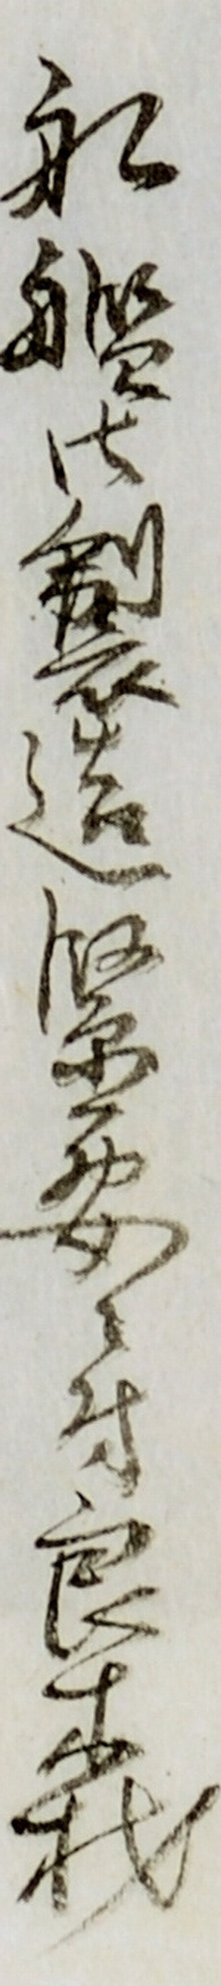船艦御製造緊要に付良木材
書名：山林方諸事御用留
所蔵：伊那市立高遠町図書館・合同会社AMANE
